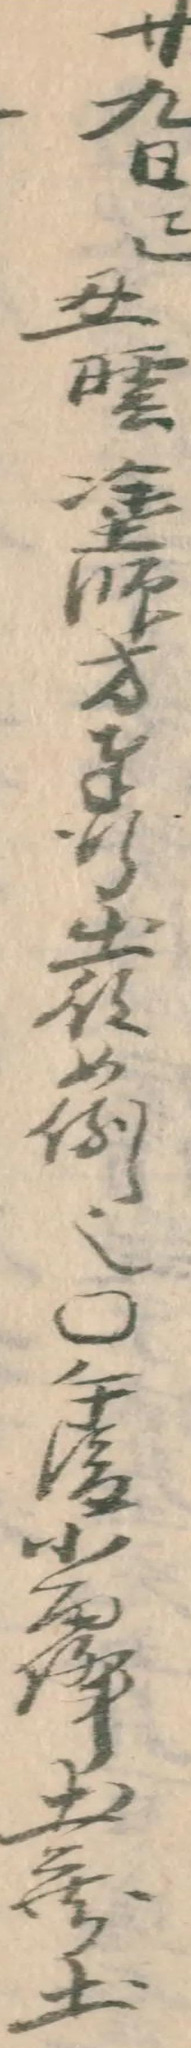廿九日己丑曇塗師方奉行出役如例也〇午後小雨降土蔵土
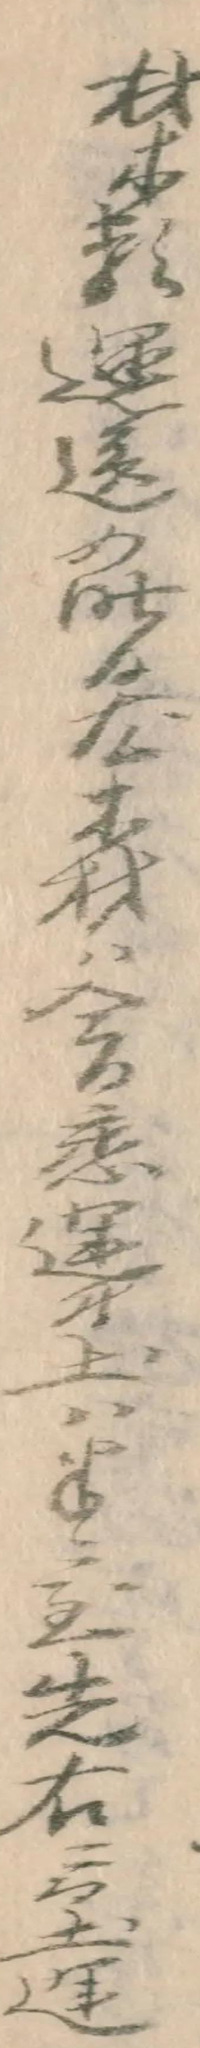材木類運送如昨日尤木材ハ今日悉運候上ハ半々互先右ニ而土運
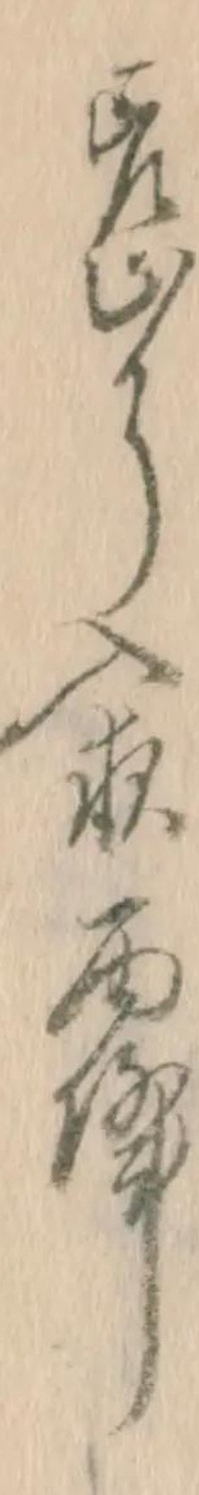差止了入夜雨降
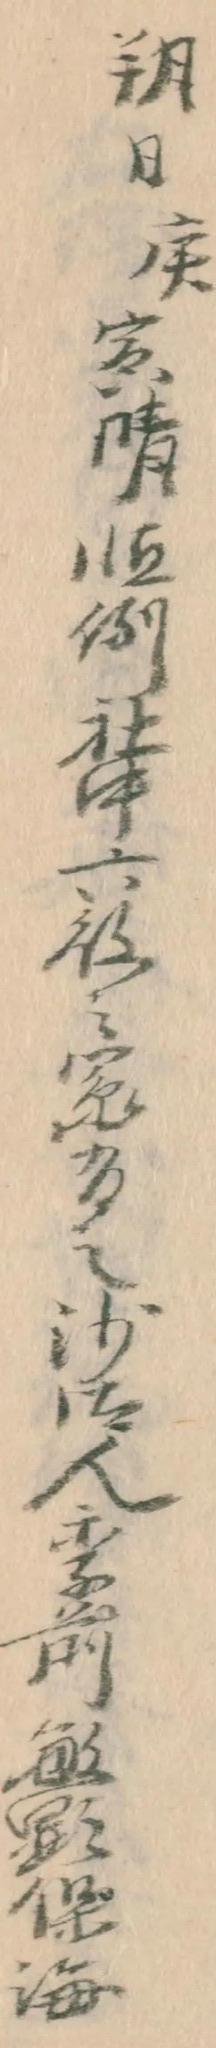朔日庚寅晴恒例社中六枚之鬮有之沙汰人季前敏顕保海
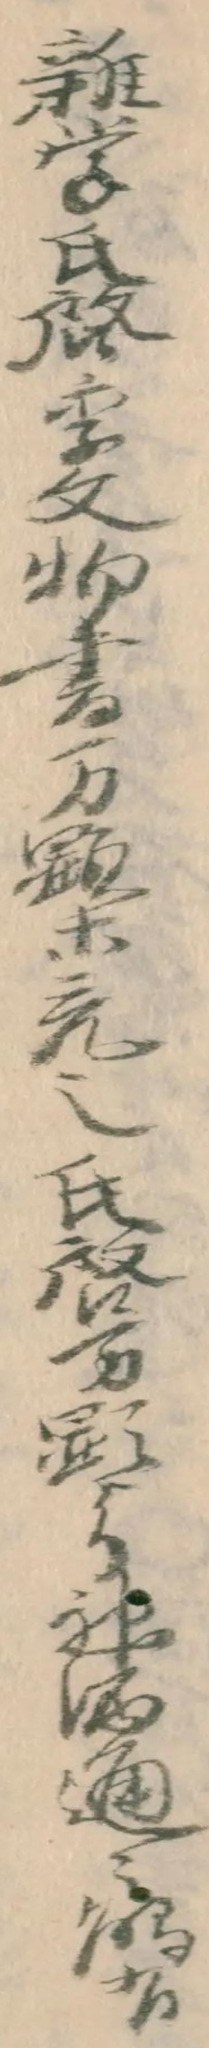雑掌氏啓季文物書万顕等充也氏啓万顕より神酒通之觸有
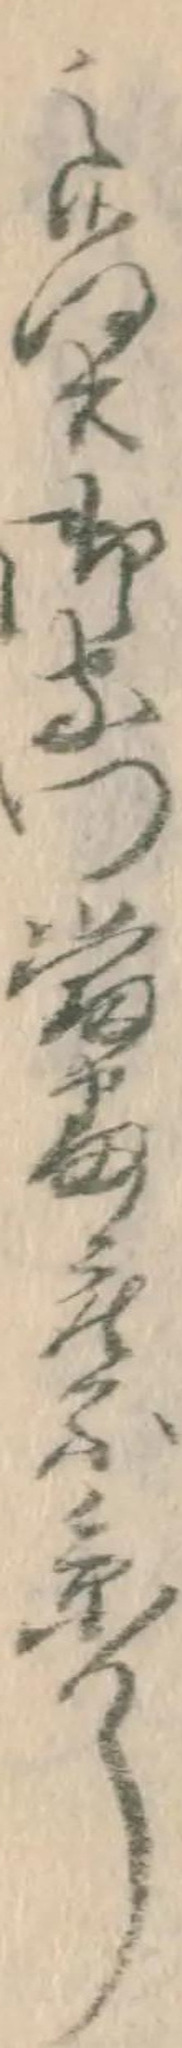之候得共御家門當番ニ付不参了
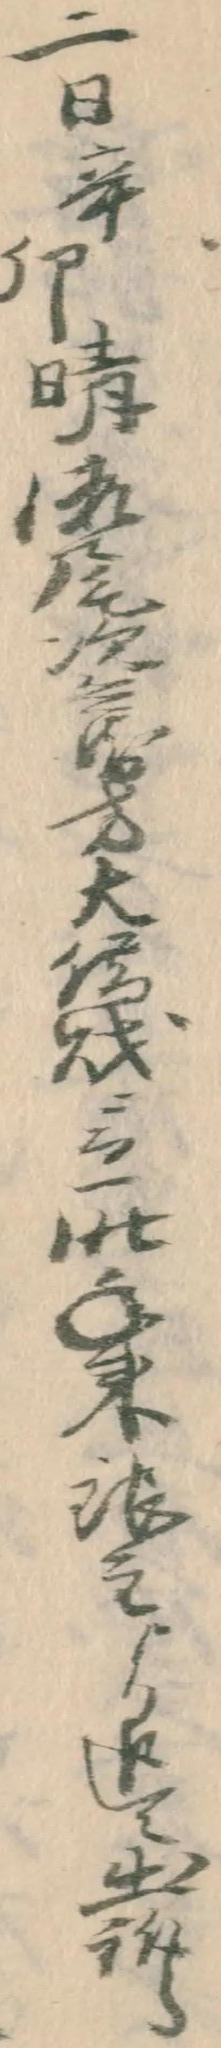二日辛卯晴瀬尾次兵衛方大借財ニ而一昨年来銀主より追々出訴
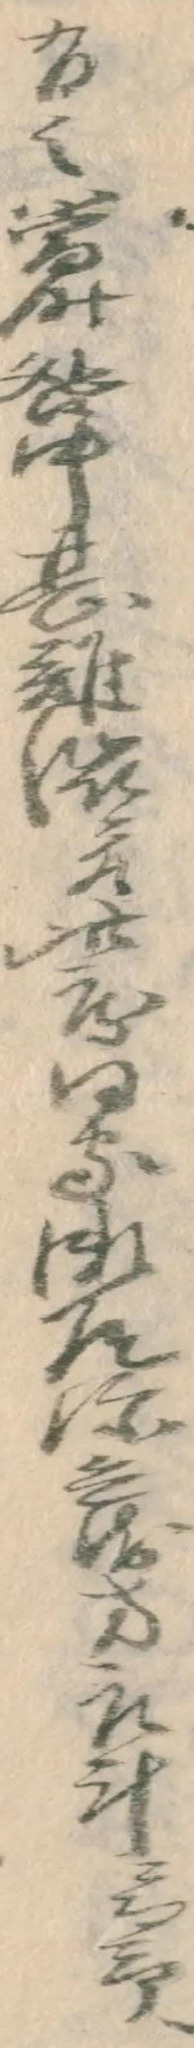有之當時咎中甚難渋ニ付此度同家瀬尾弥兵衛方取斗ニ而予ヘ
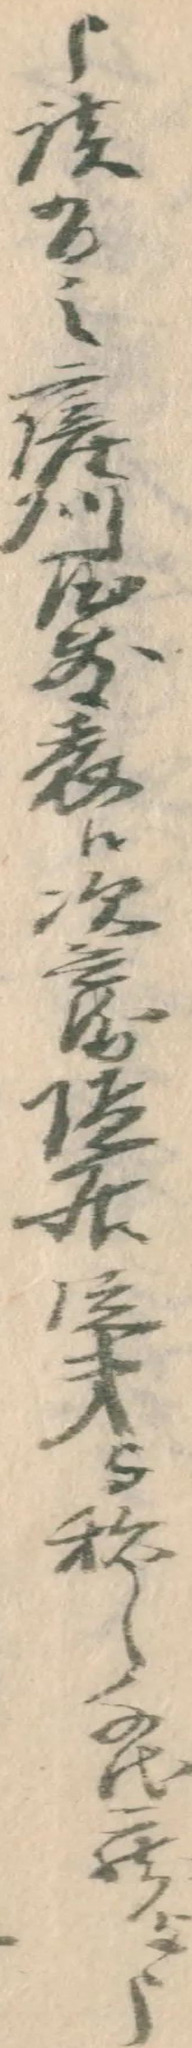申談有之薩州屋敷表え次兵衛隠居従弟と称し千代罷越申
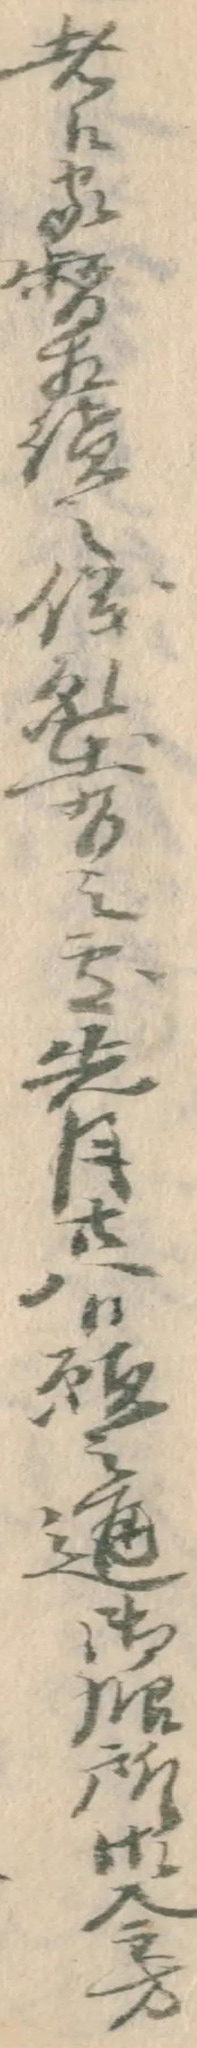者え家督相続之儀願出有之處先月廿八日願之通御服所御金方
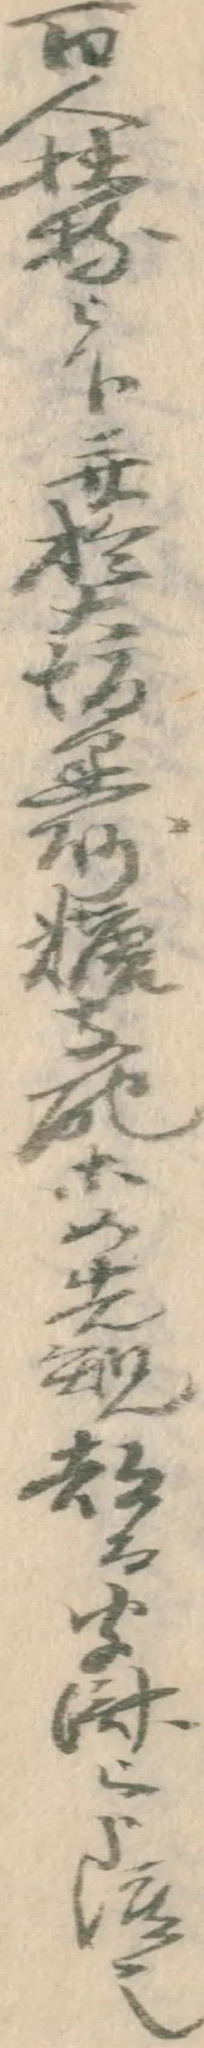百人扶持被下并於大坂黒州糠支配等如先規而聞済被申渡之
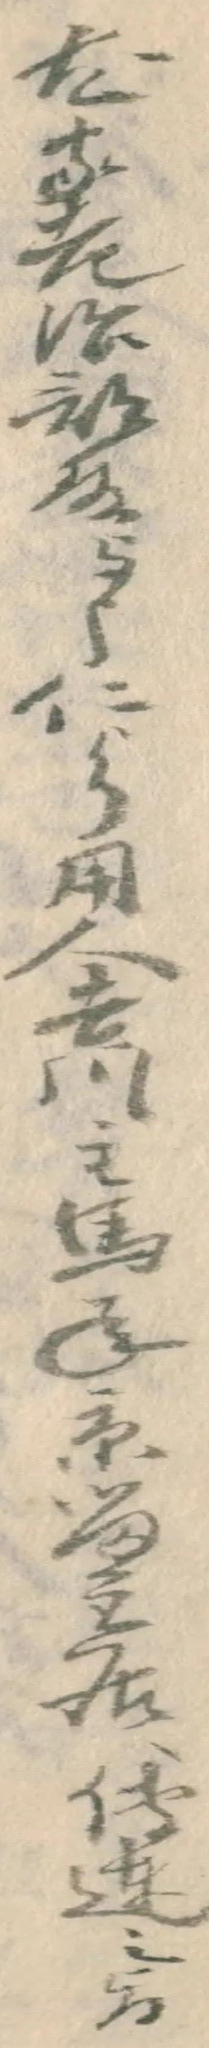尤家老治部殿と申仁より用人吉川主馬年京留主居へ傳達之旨
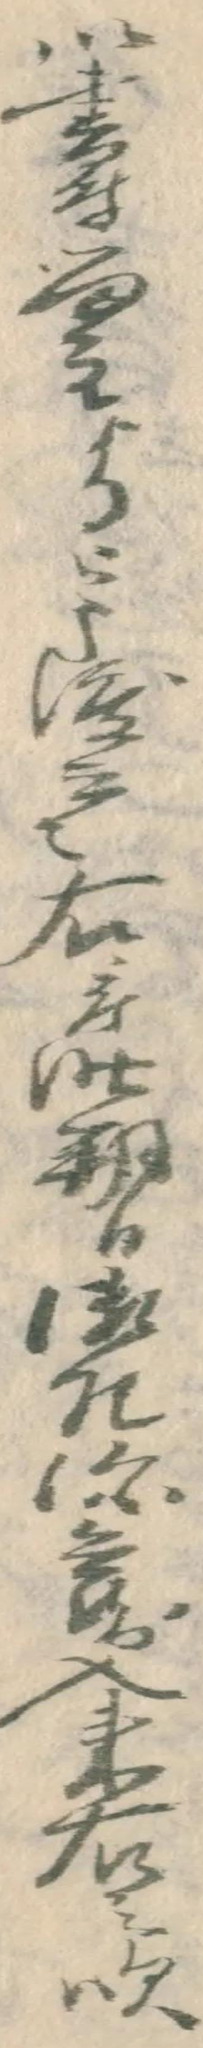以書付留主より被申渡云々右ニ付昨朔日御礼弥兵衛入来右之吹
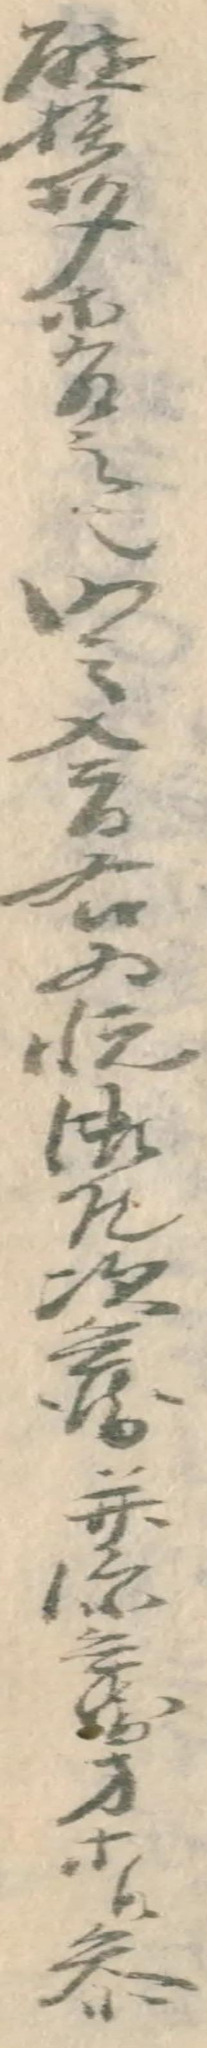能挨拶等有之也仍之入旨右為悦御屋次兵衛并源兵衛方等え参
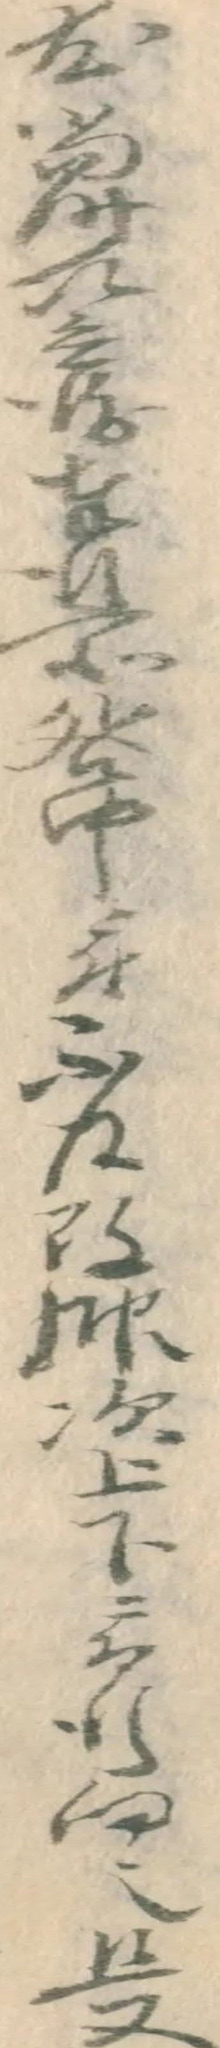尤當時比兵衛奉行所咎中ニ付不及改服次上下に而行向之且又
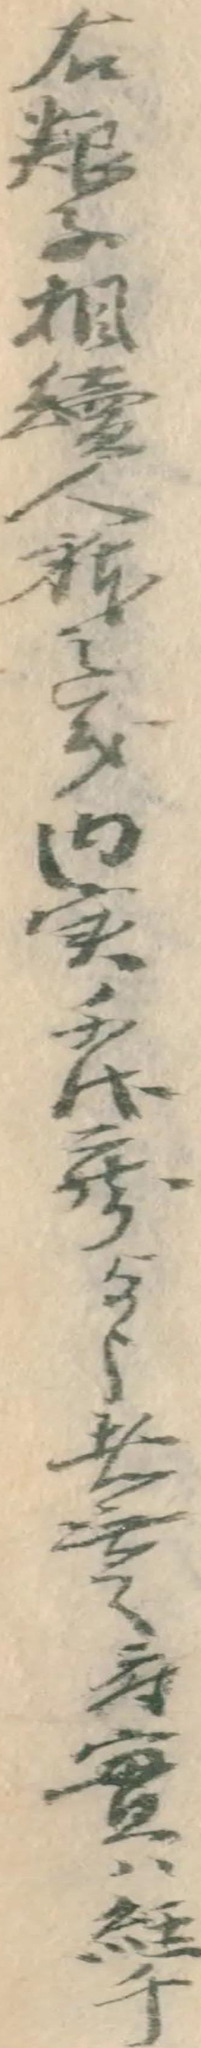右銀子相續人躰之義内実千代蔵与申者無之ニ付實は経千
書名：賀茂社記録. 第67冊
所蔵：国立国会図書館 National Diet Library, JAPAN
